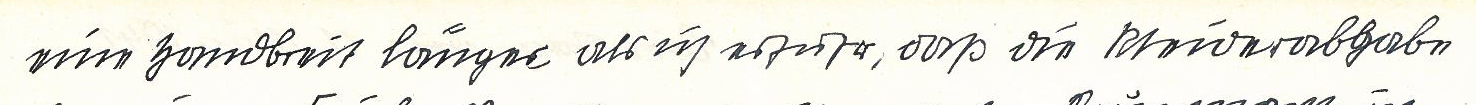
eine Handbreit länger, als ich erfuhr, daß die Kleiderabgabe
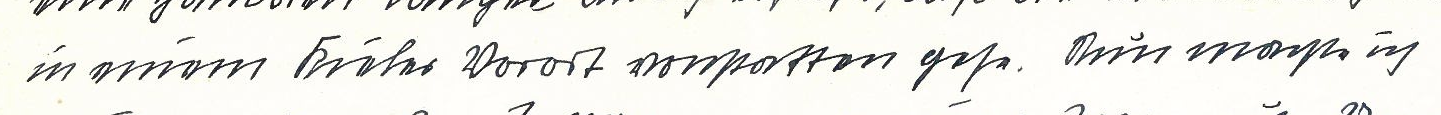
in einem Kieler Vorort vonstatten gehe. Nun machte ich
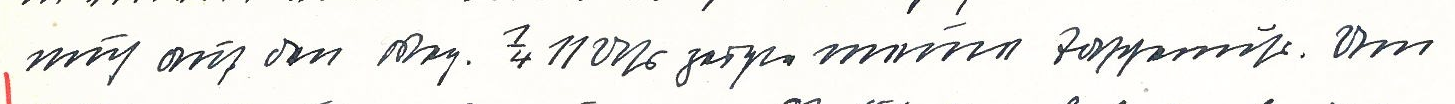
mich auf den Weg. ¼ 11 Uhr zeigte meine Taschenuhr. Um
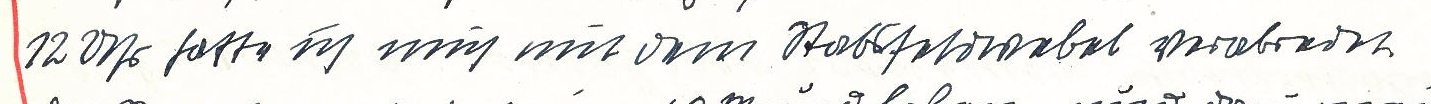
12 Uhr hatte ich mich mit dem Stabsfeldwebel verabredet.
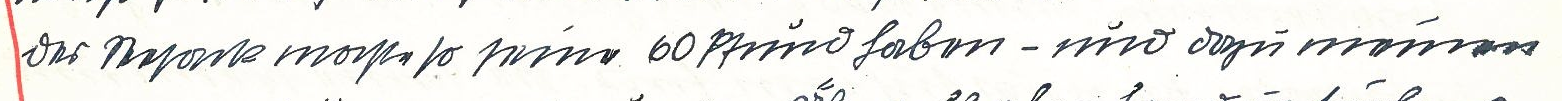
Der Seesack mochte so seine 60 Pfund haben – und dazu meinen
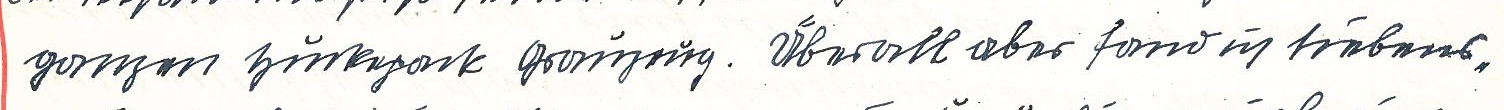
ganzen Huckepack Grauzeug. Überall aber fand ichliebens¬
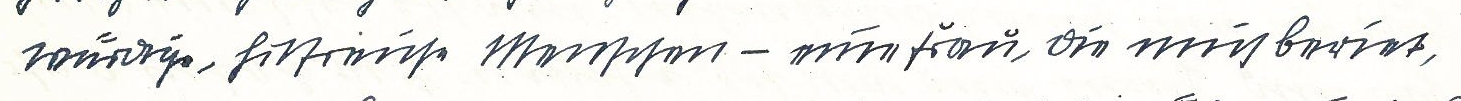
würdige, hilfreiche Menschen – eine Frau, die mich beriet,
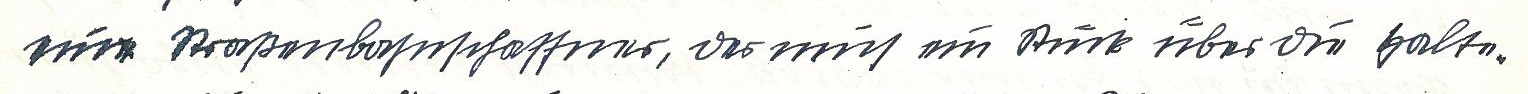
eine Straßenbahnschaffner, der mich ein Stück über die Halte¬
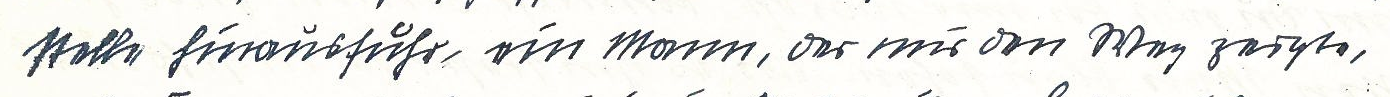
stelle hinausfuhr, ein Mann, der mir den Weg zeigte,
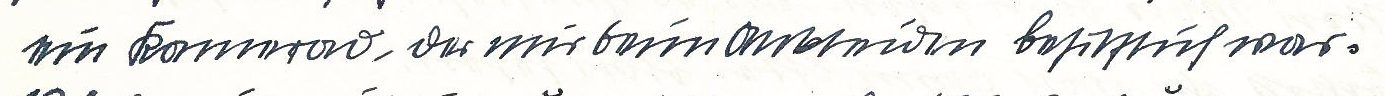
ein Kamerad, der mir beim Ankleiden behilflich war.
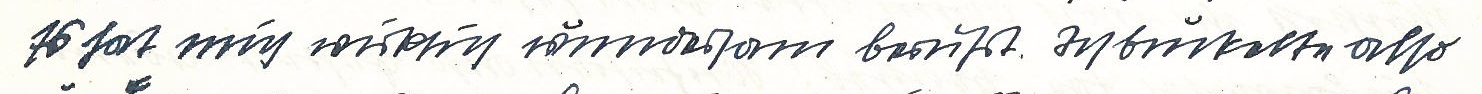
Es hat mich wirklich wundersam berührt. Ich buckelte also
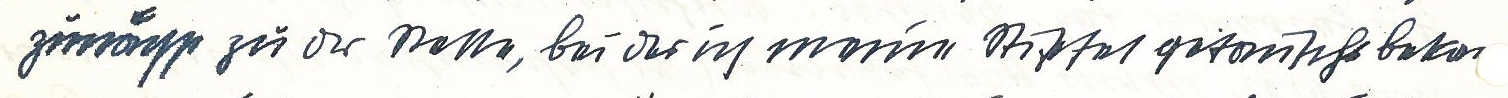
zunächst zu der Stelle, bei der ich meine Stiefel getauscht beka
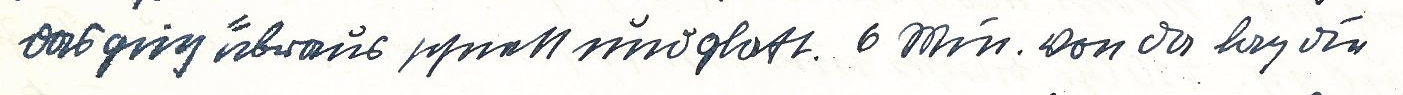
das ging überaus schnell und glatt. 6 Min. von da lag die
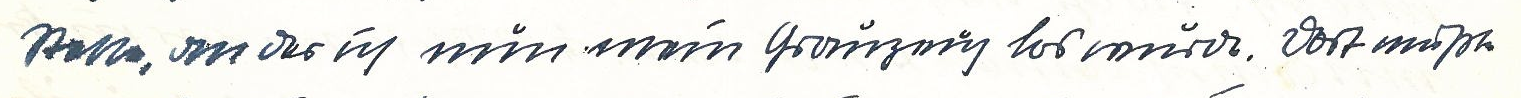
Stelle, an der ich nun mein Grauzeug los wurde. Dort mußte
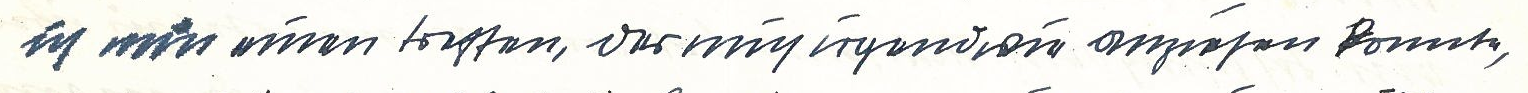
ich nun einen treffen, der mich irgendwie anziehen konnte,
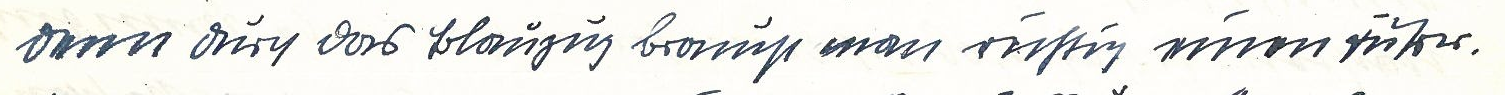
denn durch das Blauzug braucht man richtig einen Führer.
